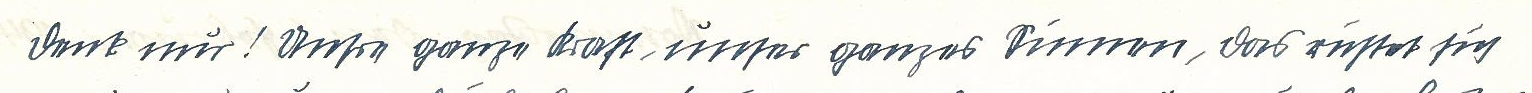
Denk nur! Unsre ganze Kraft, unser ganzes Sinnen, das richtet sich
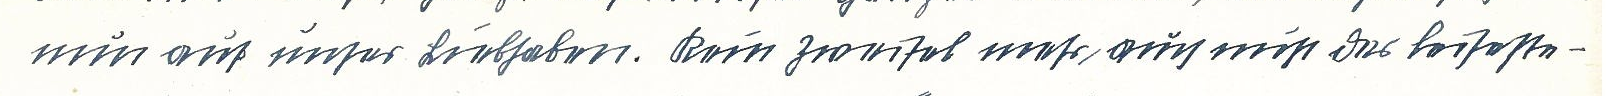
nun auf unser Liebhaben. Kein Zweifel mehr, auch nicht der leiseste –
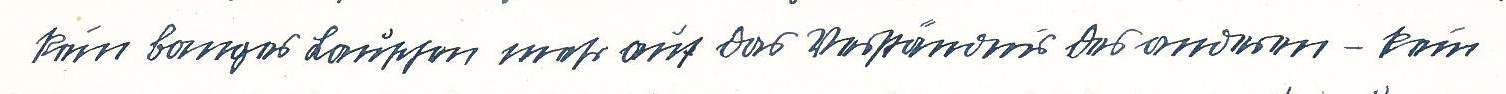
kein banges Lauschen mehr auf das Verständnis des anderen – kein
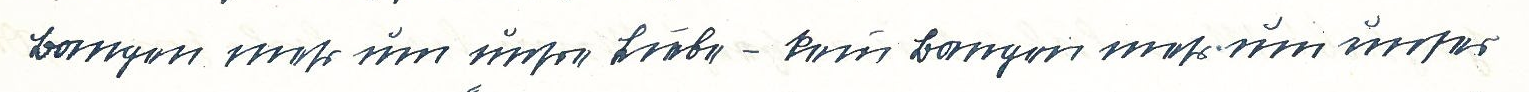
Bangen mehr um unsre Liebe – kein Bangen mehr um unser
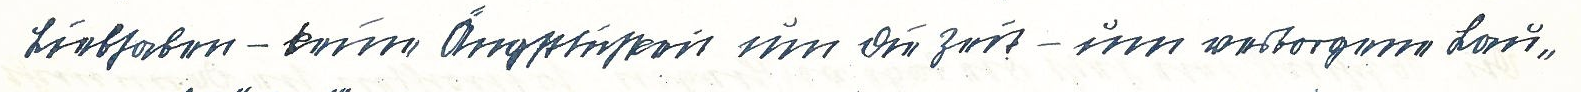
Liebhaben – keine Ängstlichkeit um die Zeit – um verborgene Lau¬
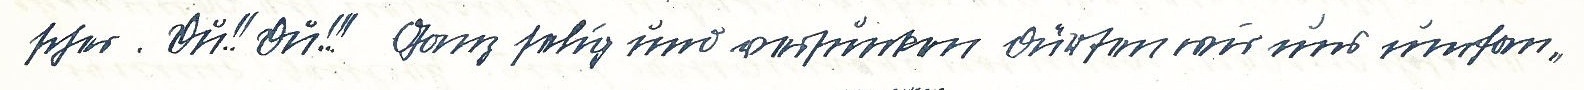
scher. Du!! Du!!! Ganz selig und versunken dürfen wir uns umfan¬
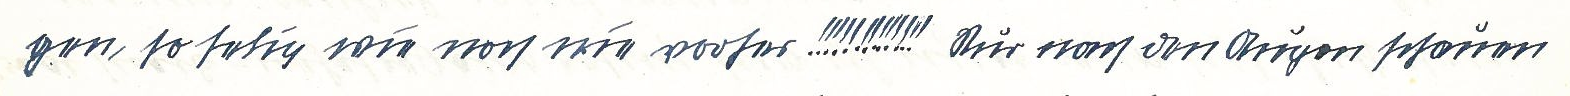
gen, so selig wie noch nie vorher!!!!!!!!!!!! Nur nach den Augen schauen
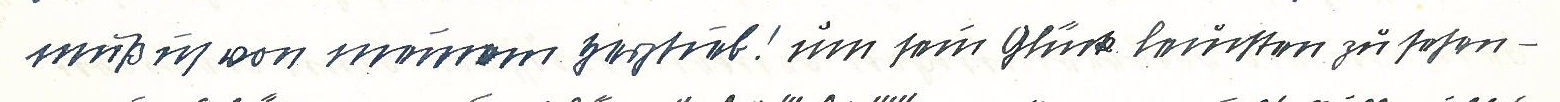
muß ich von meinem Herzlieb! um sein Glück leuchten zu sehen –
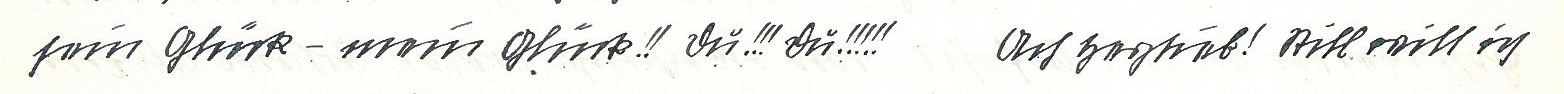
sein Glück – mein Glück!! Du!!! Du!!!!! Ach Herzlieb! Still will ich
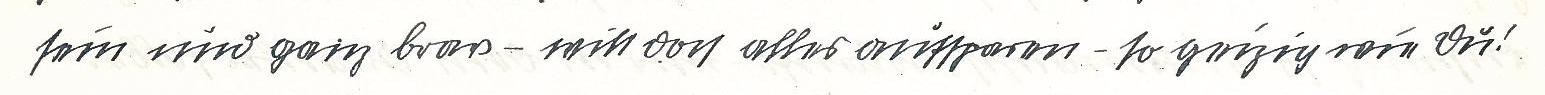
sein und ganz brav – will das alles aufsparen – so geizig wie Du!
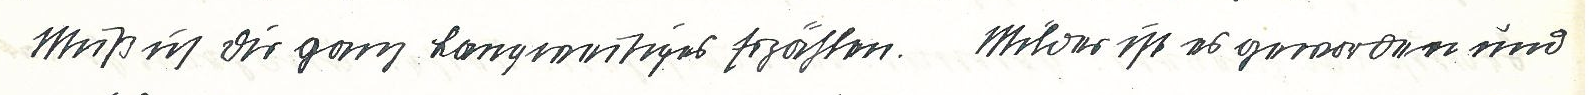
Muß ich Dir ganz Langweiliges erzählen. Milder ist es geworden und
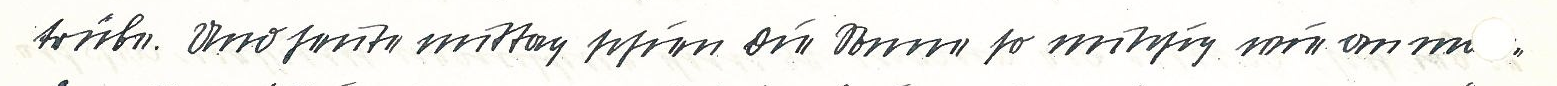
trübe. Und heute mittag schien die Sonne so milchig wie an m¬
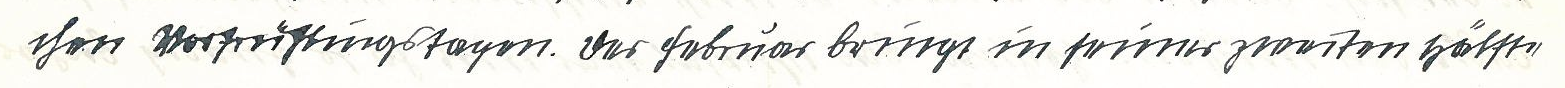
chen Vorfrühlingstagen. Der Februar bringt in seiner zweiten Hälfte
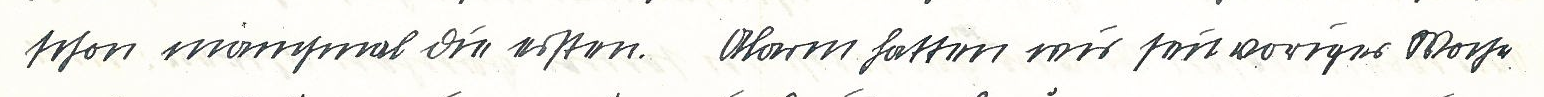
schon manchmal die ersten. Alarm hatten wir seit voriger Woche
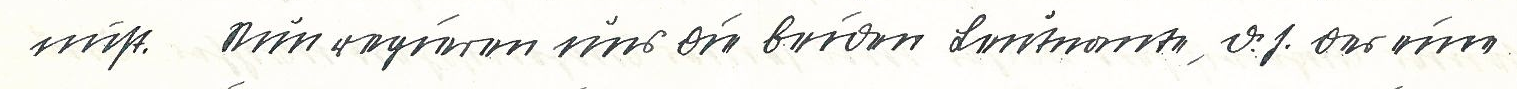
nicht. Nun regieren uns die beiden Leutnante, d.h. der eine
